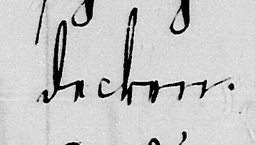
decken.
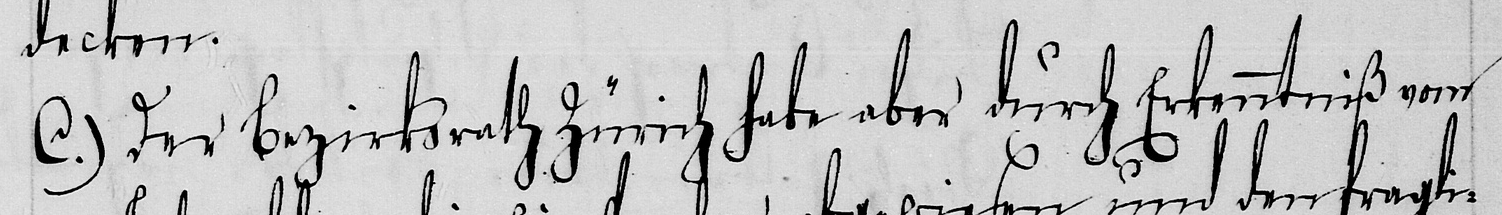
C.) Der Bezirksrath Zürich habe aber durch Erkenntniß vom
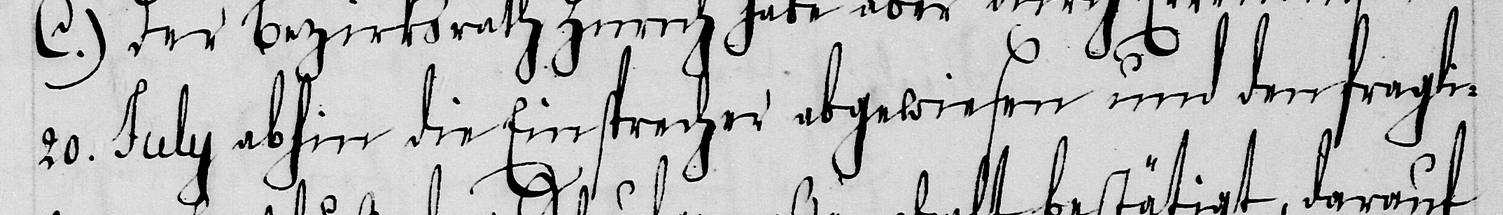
20. July abhin die Einsprecher abgewiesen und den fragli¬
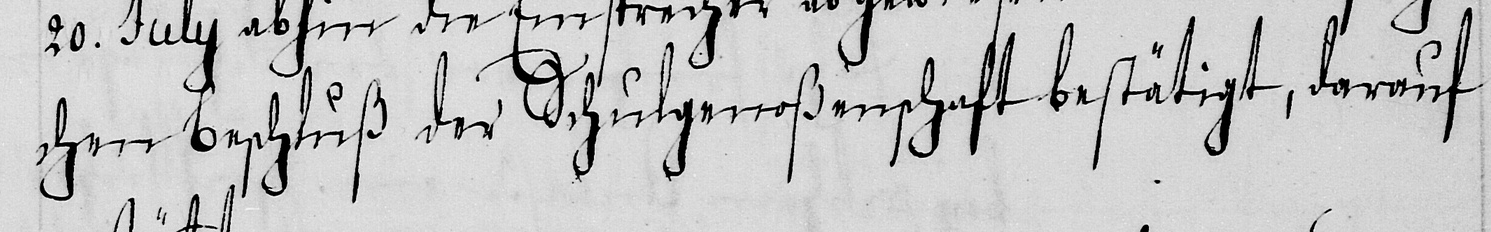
chen Beschluß der Schulgenoßenschaft bestätigt, darauf
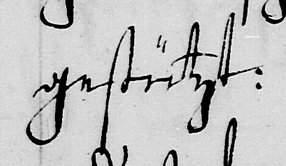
gestützt:
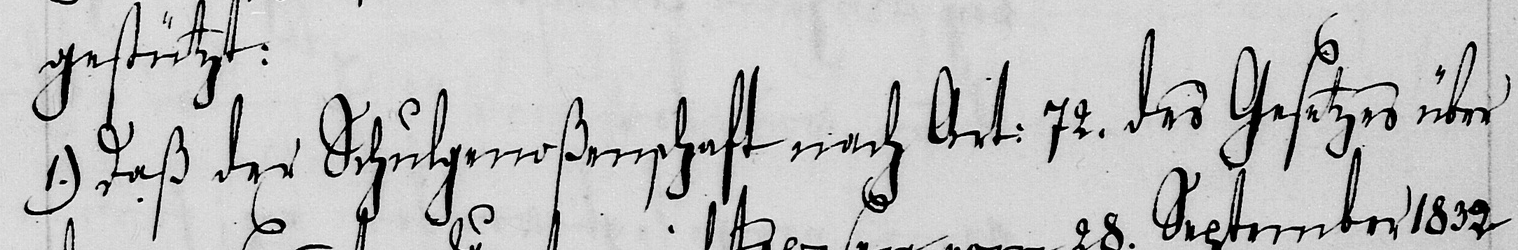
1.) Daß der Schulgenoßenschaft nach Art: 72. des Gesetzes über
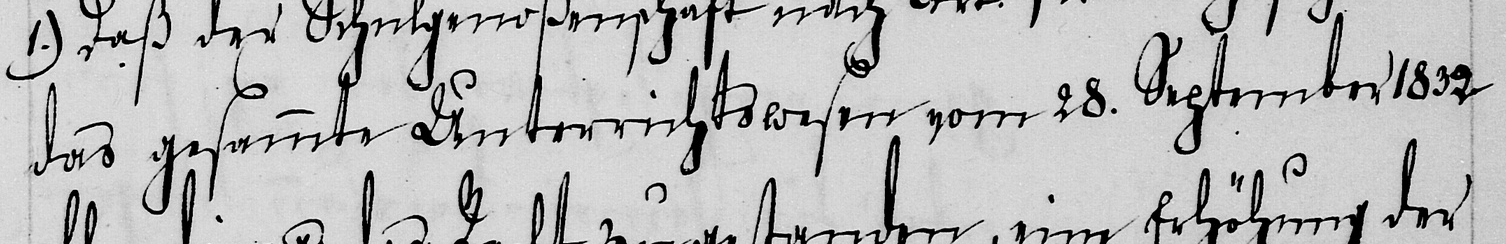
das gesammte Unterrichtswesen vom 28. September 1832
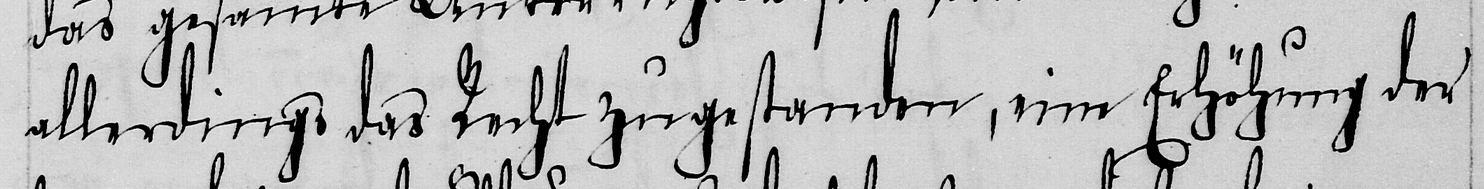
allerdings das Recht zugestanden, eine Erhöhung der
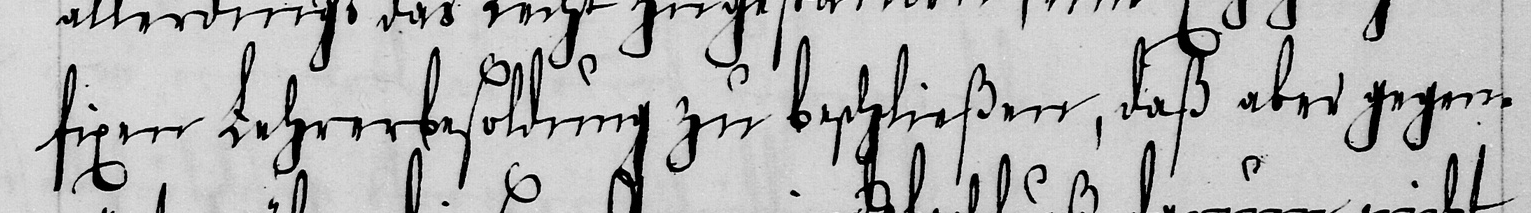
fixen Lehrerbesoldung zu beschließen, daß aber gegen¬
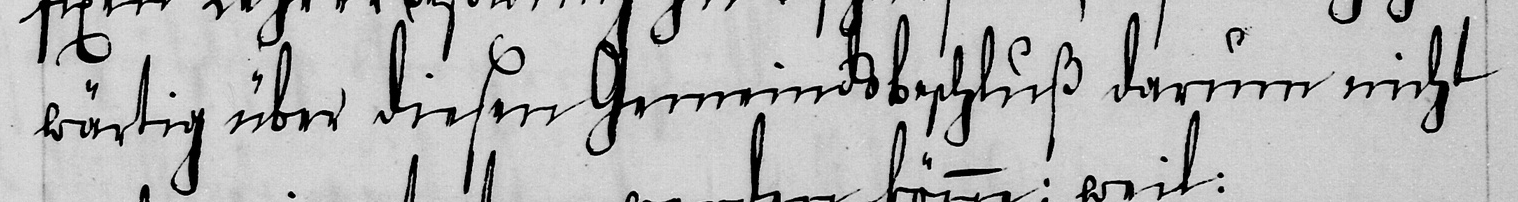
wärtig über diesen Gemeindsbeschluß darum nicht
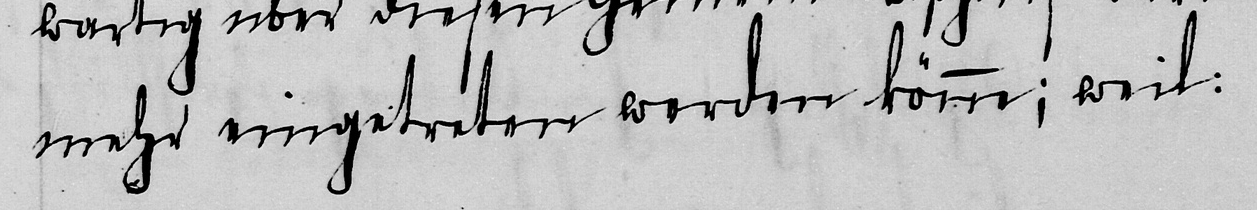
mehr eingetreten werden könne; weil:
